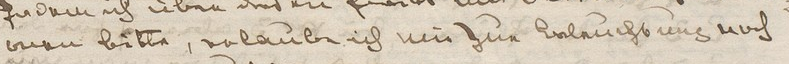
onen bitte, erlaube ich mir zur Erleuchtung noch
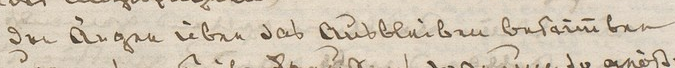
Den Ärger über das Ausbleiben bestimmter
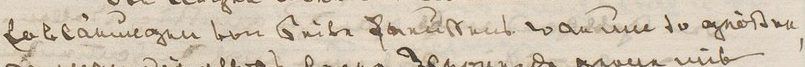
Erklärungen von Seite Preussens war um so größer,
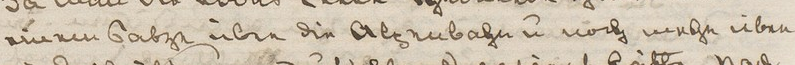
einem Satze über die Alpenbahn u noch mehr über
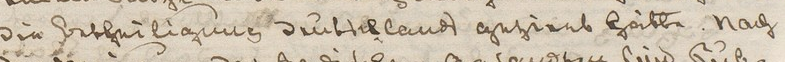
die Betheiligung Deutschlands geziert hätte. Nach
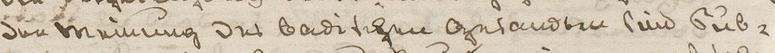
der Meinung des badischen Gesandten sind Sub-
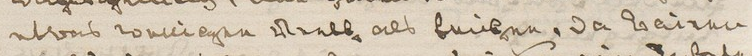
etwas weniger Werth als früher, da Baiern
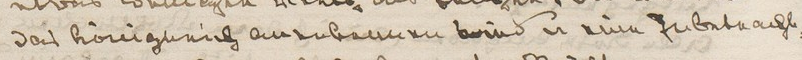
das Königreich anerkennen wird u eine Inbetracht-
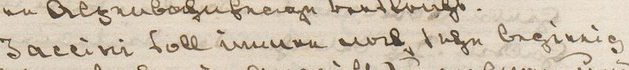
Jaccini soll immer noch sehr begierig
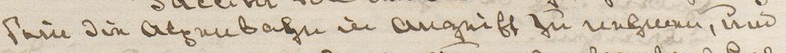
sein die Alpenbahn in Angriff zu nehmen, und
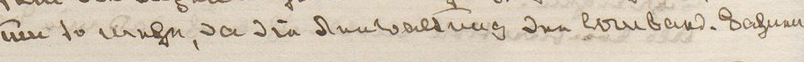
um so mehr, da die Verwaltung der Lombard. Bahnen
